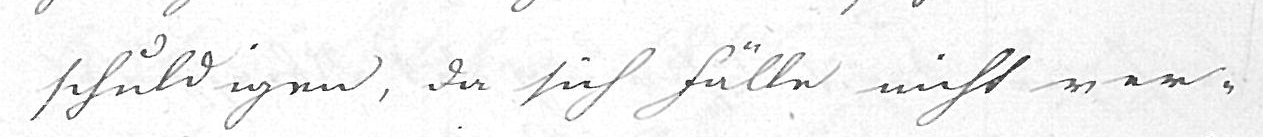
schuldigen, da sich Fälle nicht ver-
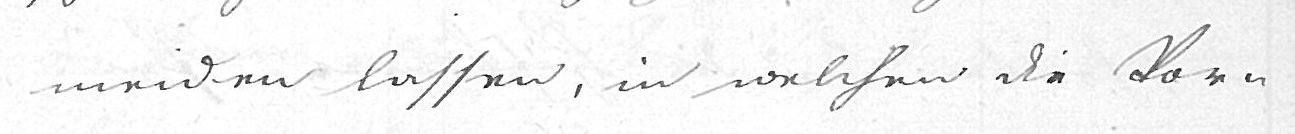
meiden lassen, in welchen die Vor-
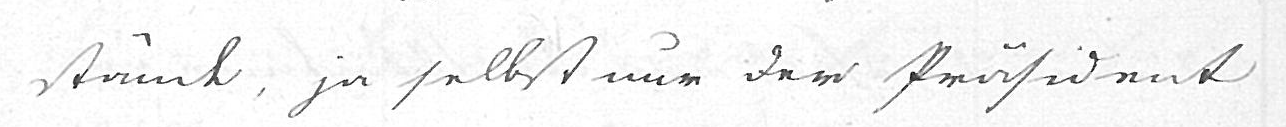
stände, ja selbst nur der Präsident
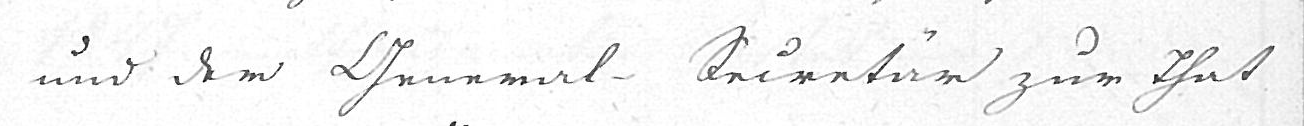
und der General-Secretär zur That
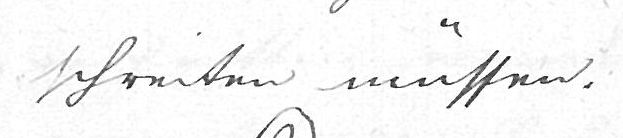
schreiten müssen.
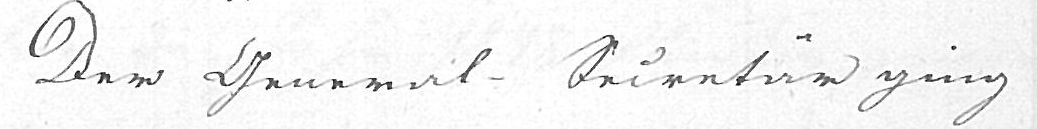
Der General-Secretär ging
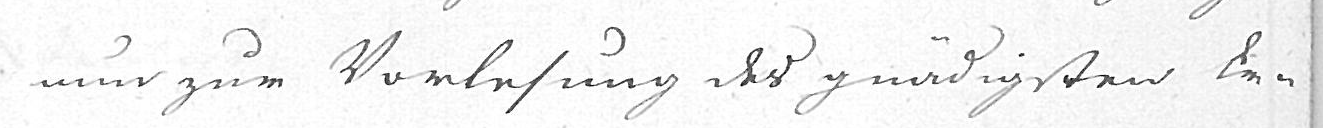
nun zur Vorlesung des gnädigsten Er-
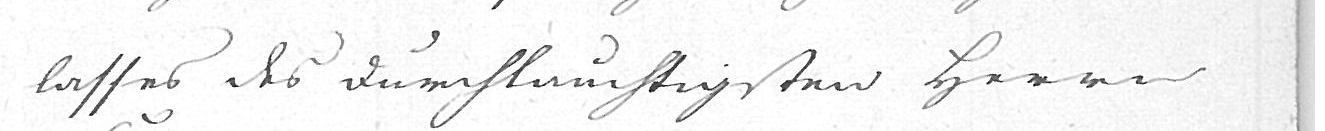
lasses des durchlauchtigsten Herrn
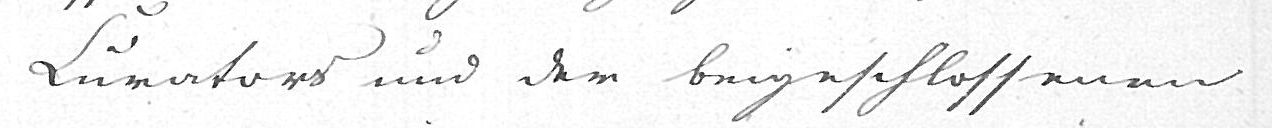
Curator und der beigeschlossenen
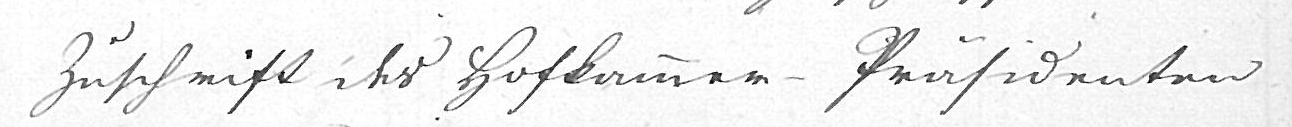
Zuschrift des Hofkammer-Präsidenten
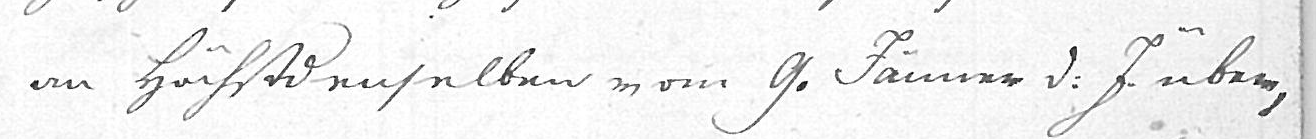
an Höchstdenselben vom 9. Jänner d. J. über
